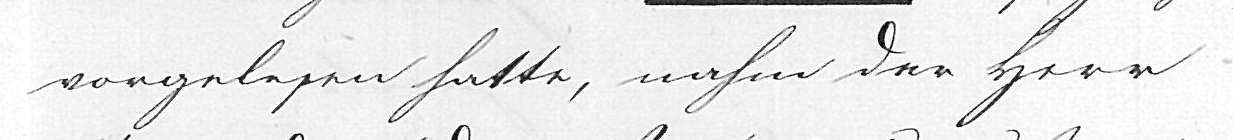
vorgelesen hatte, nahm der Herr
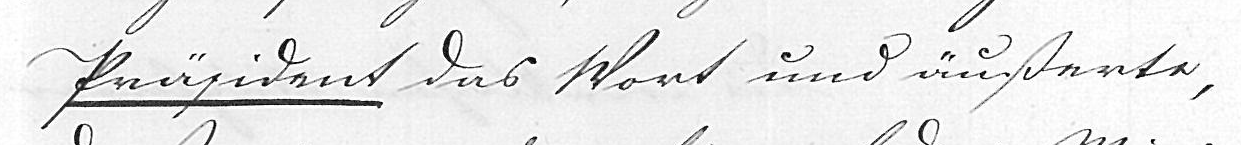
Präsident das Wort und äußerte,
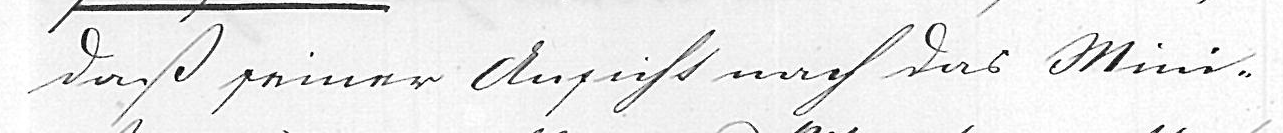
daß seiner Ansicht nach das Mini-
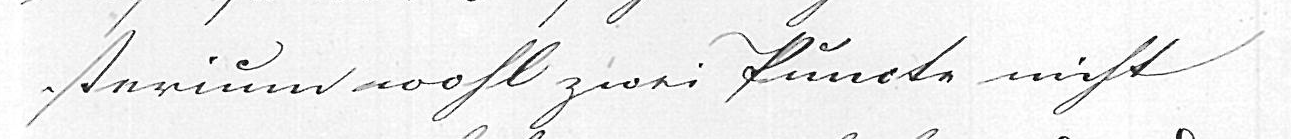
sterium wohl zwei Puncte nicht
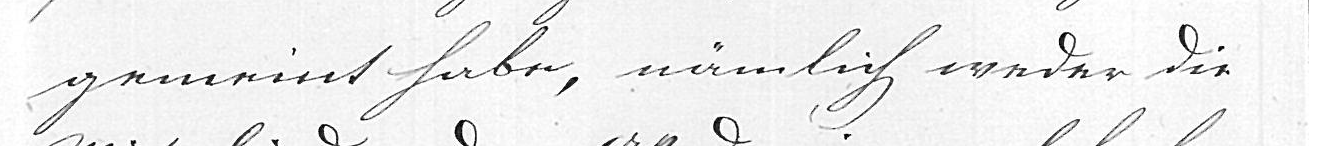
gemeint habe, nämlich weden die
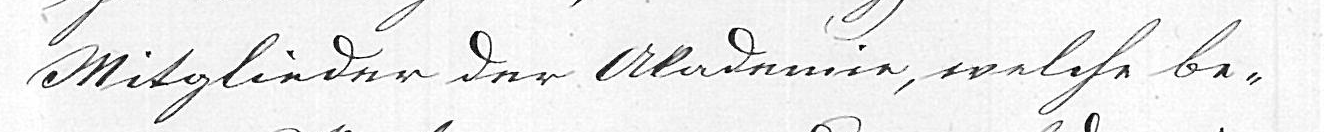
Mitglieder der Akademie, welche be-
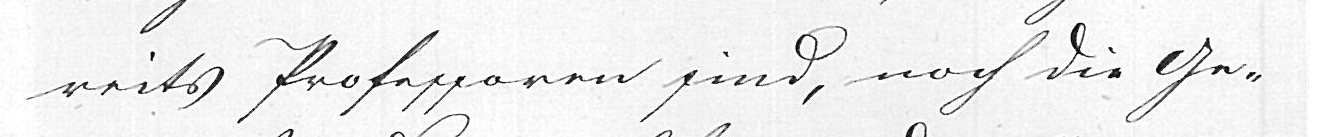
reits Professoren sind, noch die Ge-
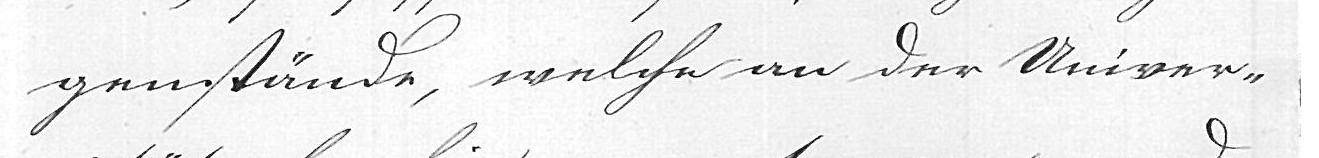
genstände, welche an der Univer-
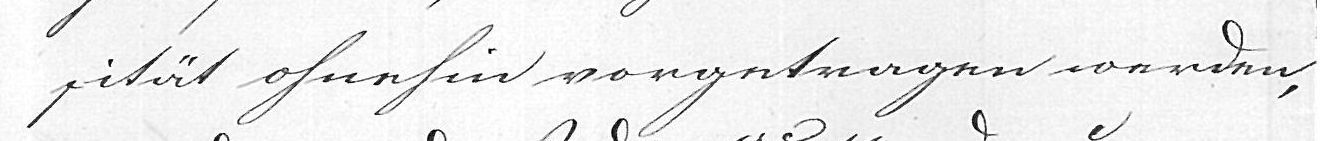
sität ohnehin vorgetragen werden,
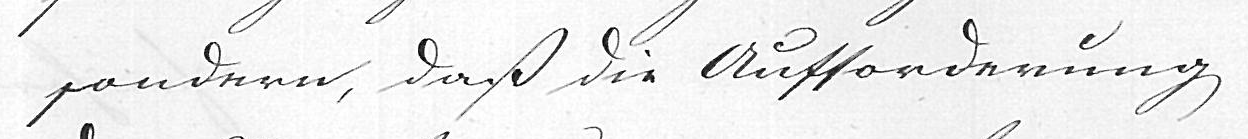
sondern, daß die Aufforderung
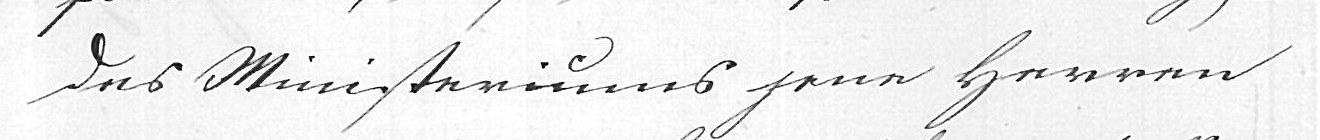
des Ministeriums jene Herren
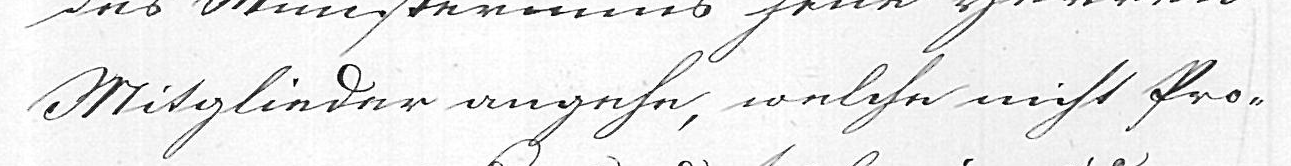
Mitglieder angehe, welche nicht Pro-
